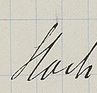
Herr
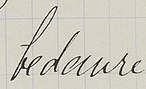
bedaure
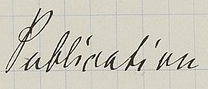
Publication
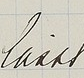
Ihrer
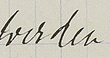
auf sich
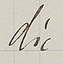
Sie
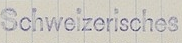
werden begreifen
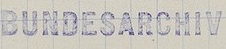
nichts weiter thun
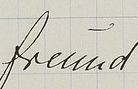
kann,
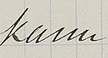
geschehen
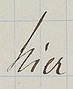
ist.
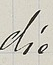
Die
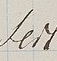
seit
